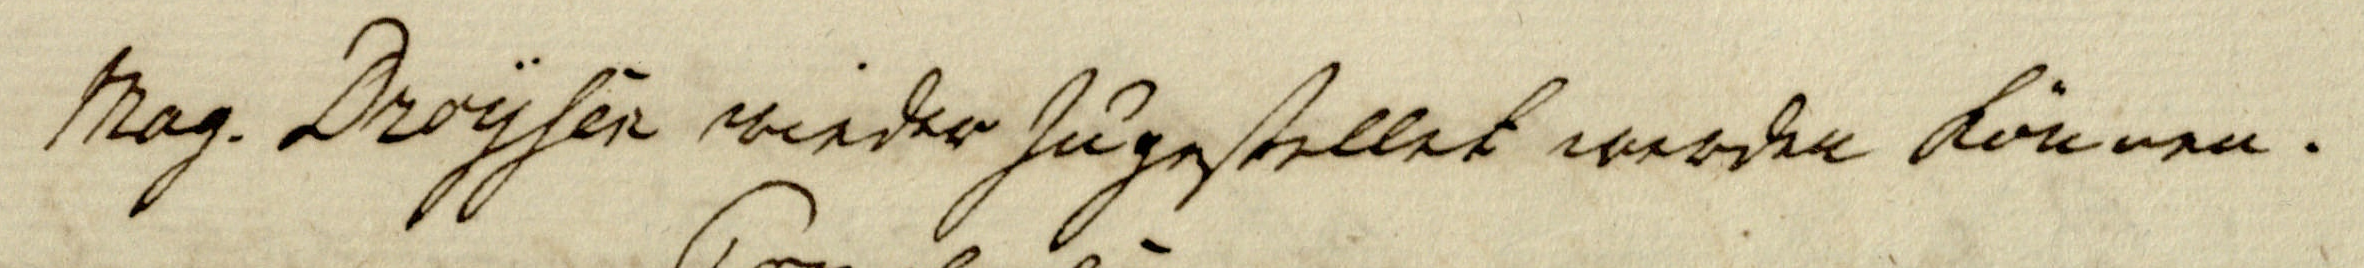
Mag. Droÿsen wieder zugestellet werden können.
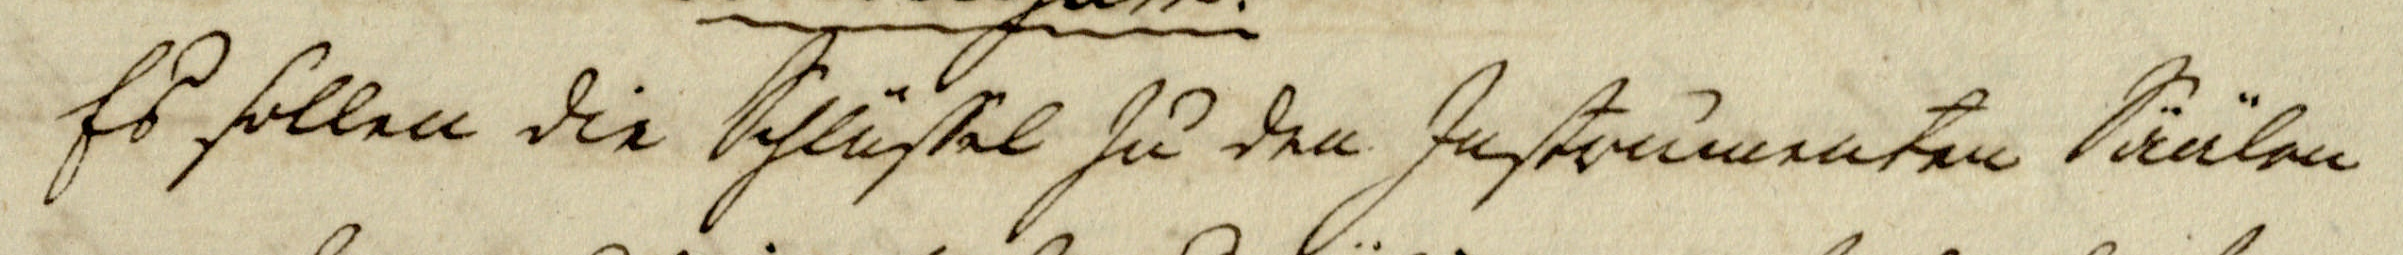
Es sollen die Schlüssel zu den Instrumenten Säälen
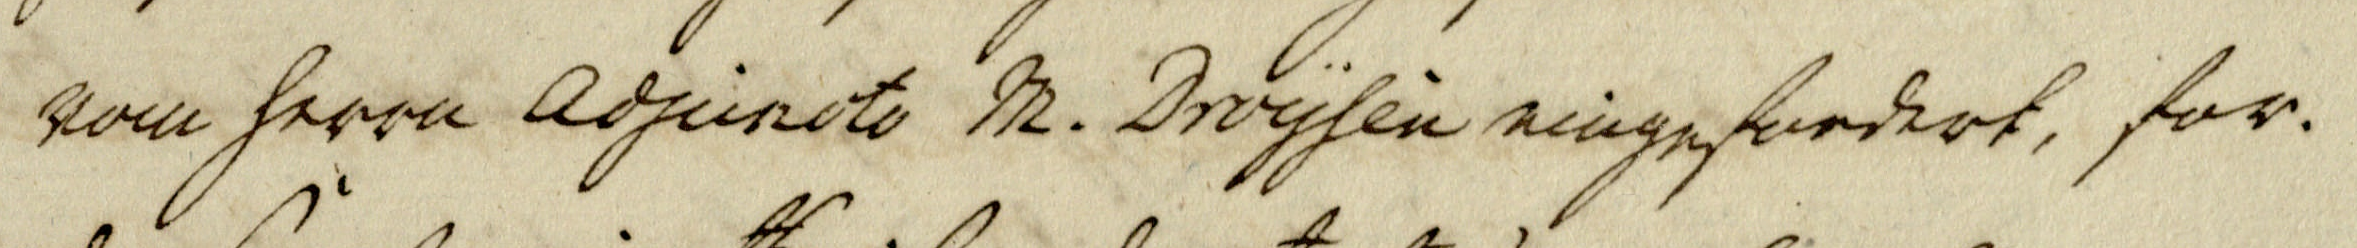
vom Herrn Adjuncto M. Droÿsen eingefordert, for¬
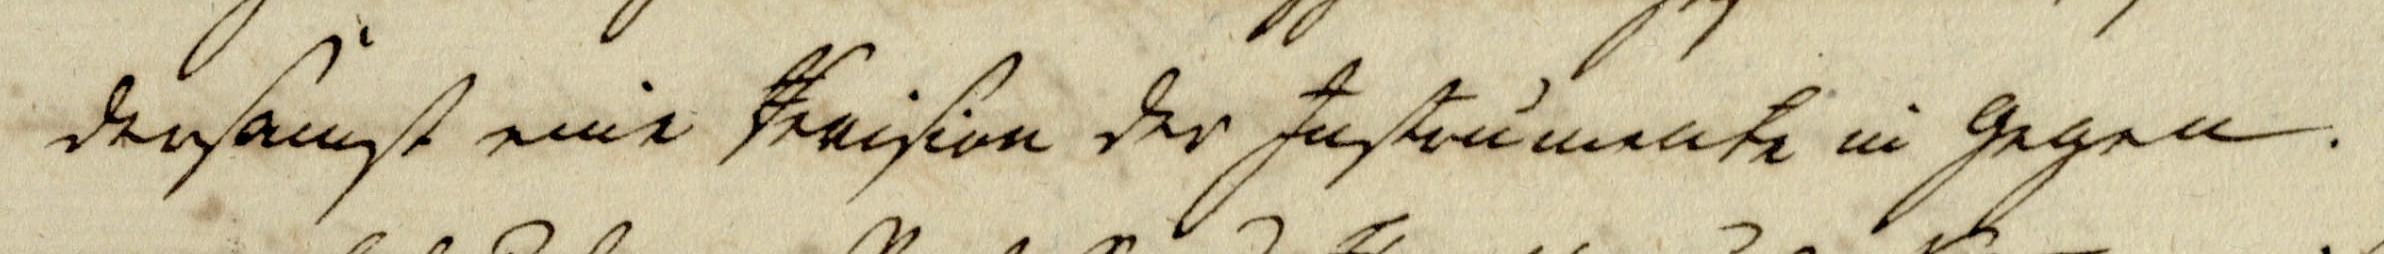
dersamst eine Revision der Instrumente in Gegen¬
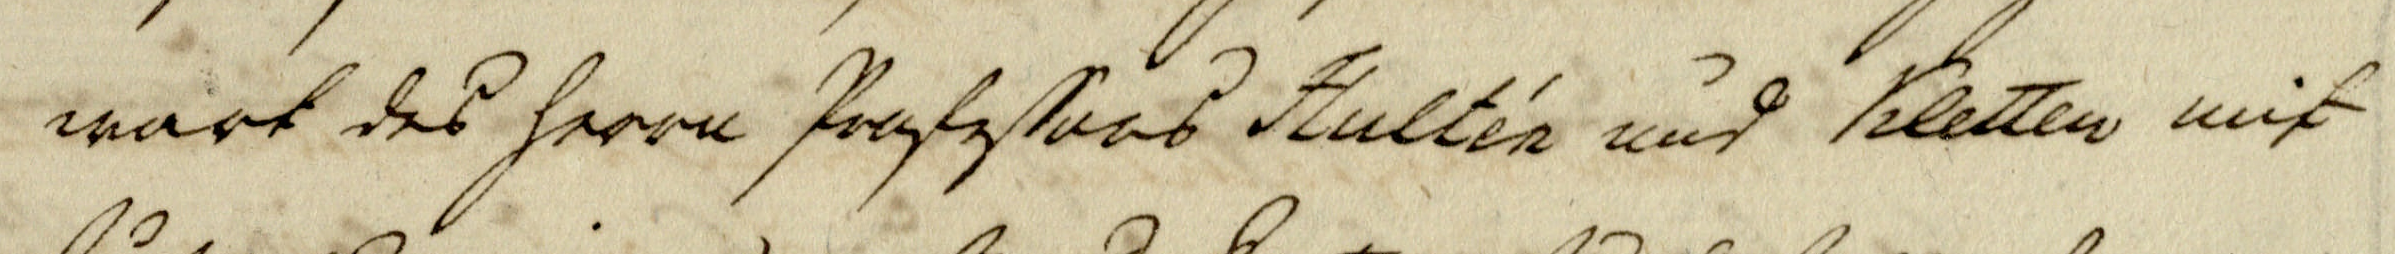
wart des Herrn Professors Hultén und Kletten mit
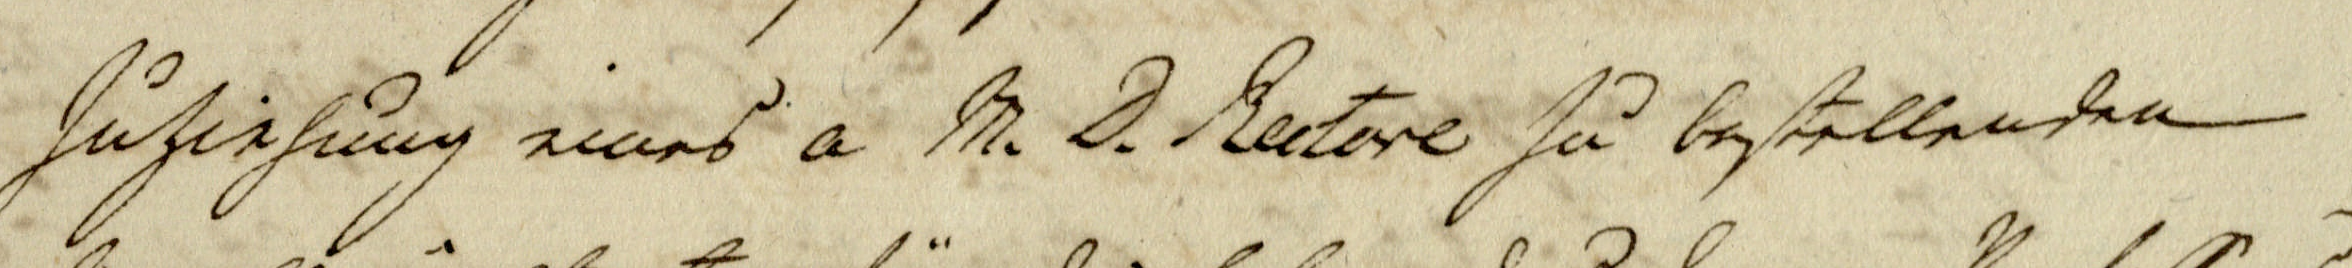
Zuziehung eines a M. D. Rectore zu bestellenden
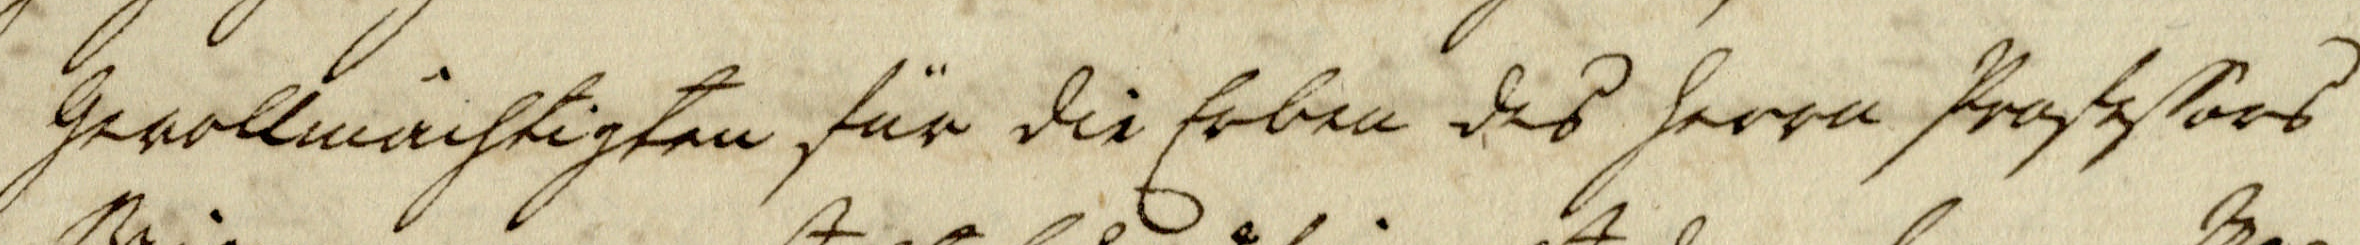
Gevollmächtigten für die Erben des Herrn Professors
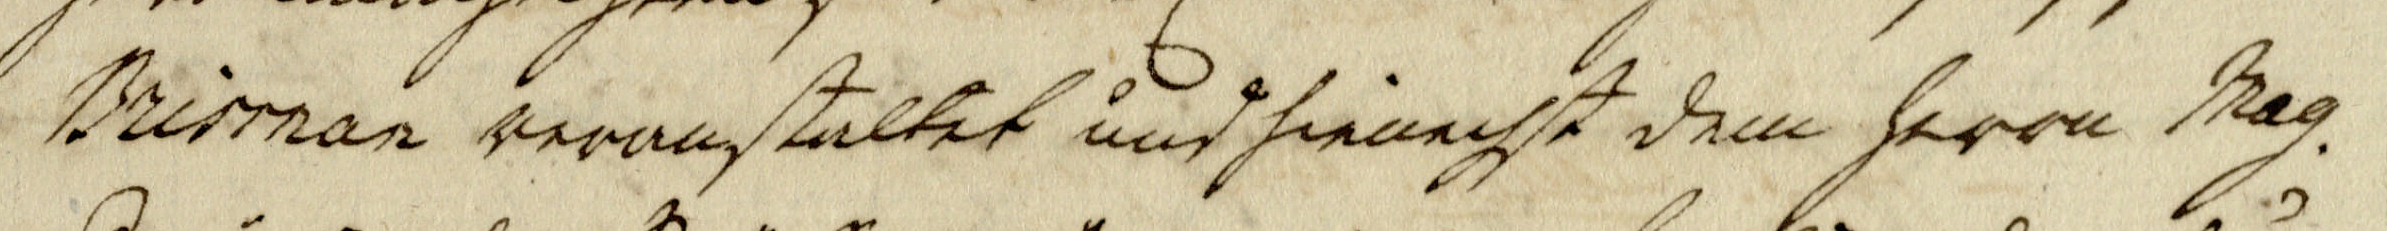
Brisman veranstaltet und hienechst dem Herrn Mag.
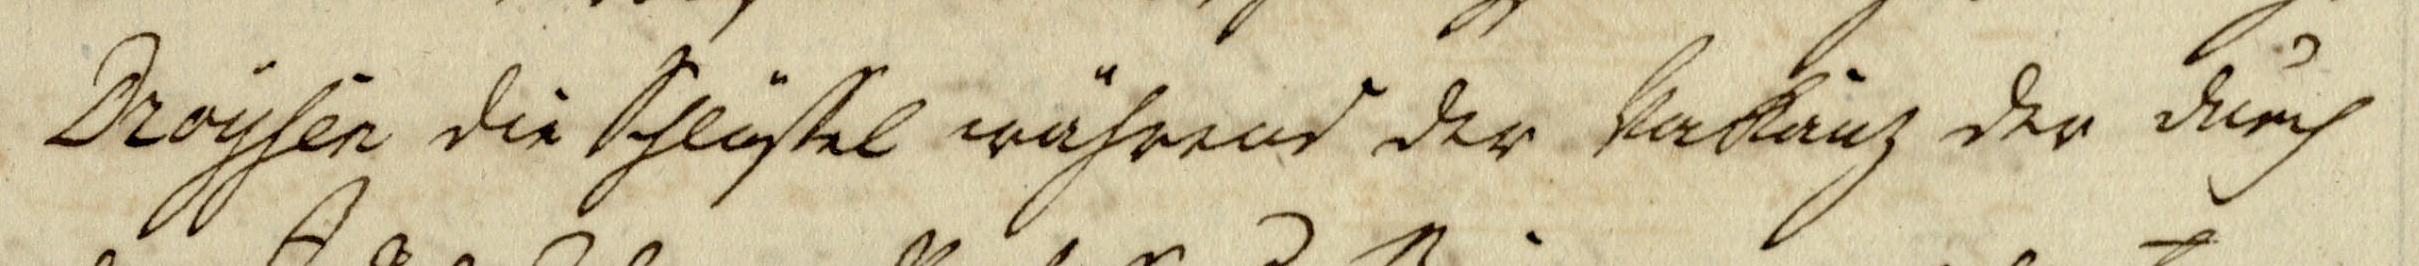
Droÿsen die Schlüssel während der Vakanz der durch
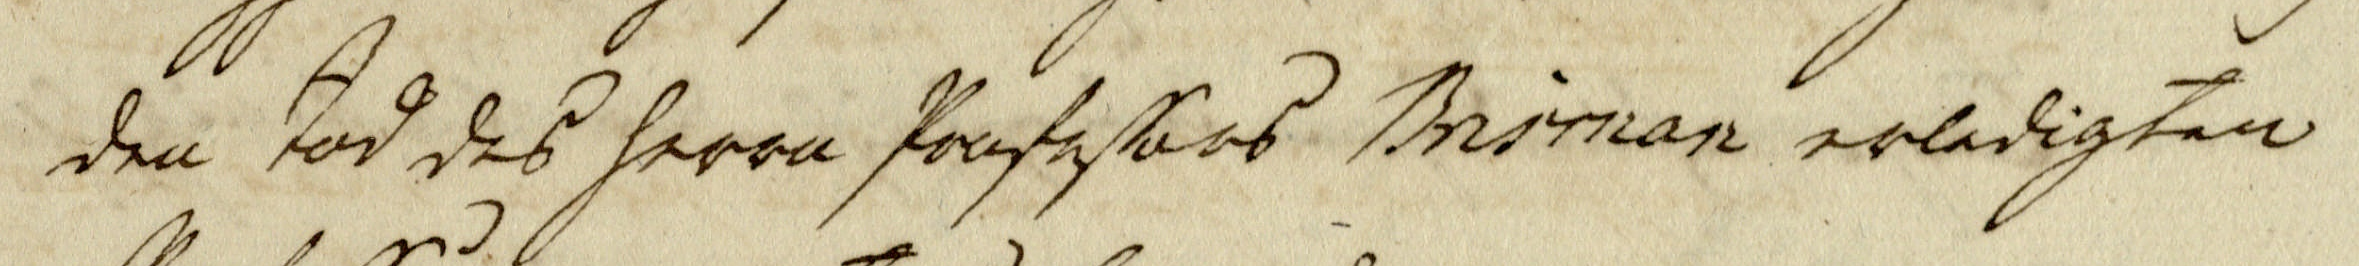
den Tod des Herrn Professors Brisman erledigten
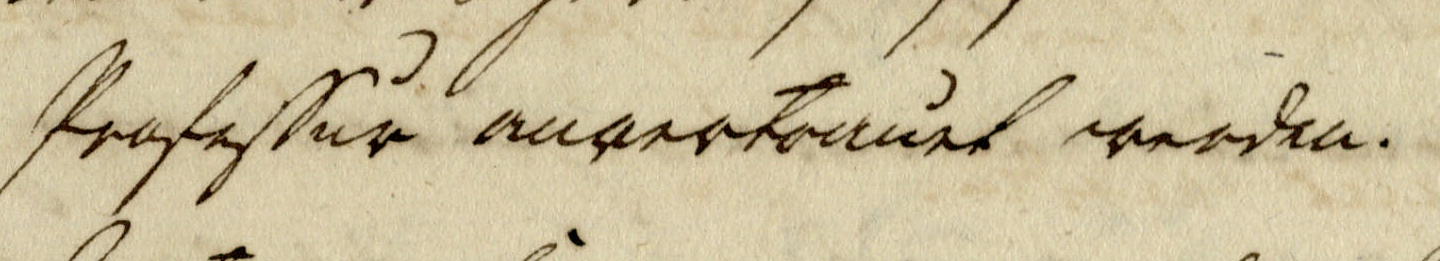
Professur anvertrauet werden.
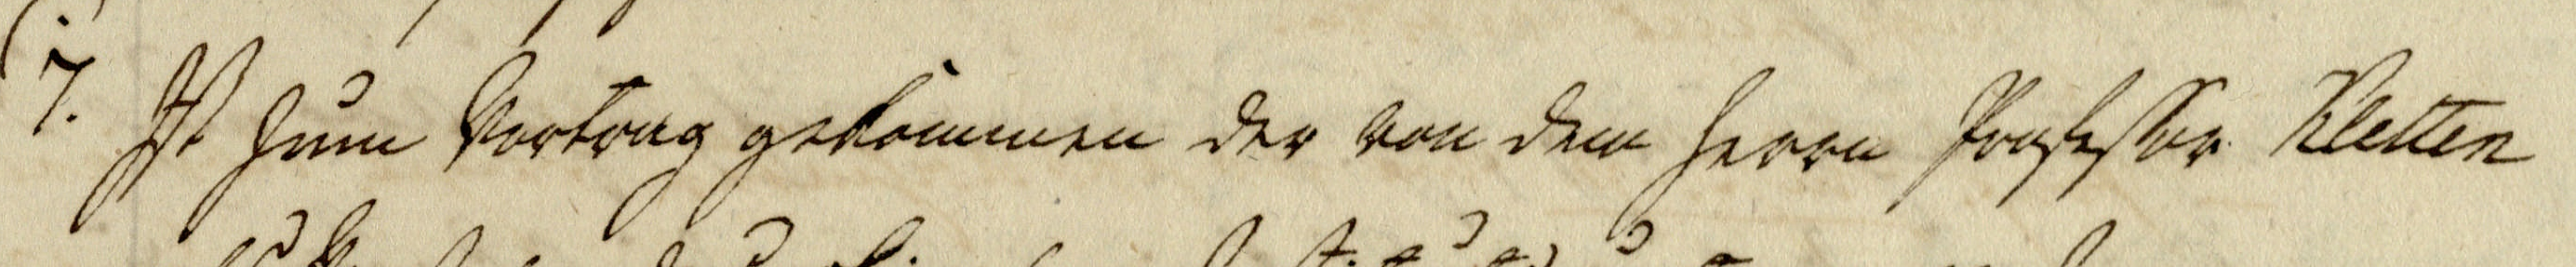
7. Ist zum Vortrag gekommen der von dem Herrn Professor Kletten
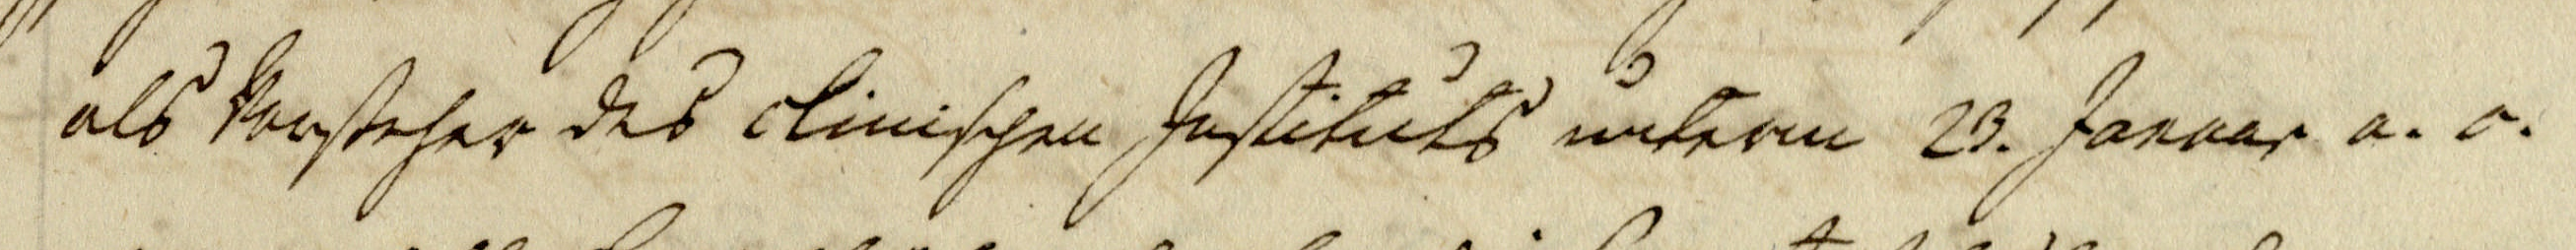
als Vorsteher des clinischen Instituts unterm 23. Januar a. c.
